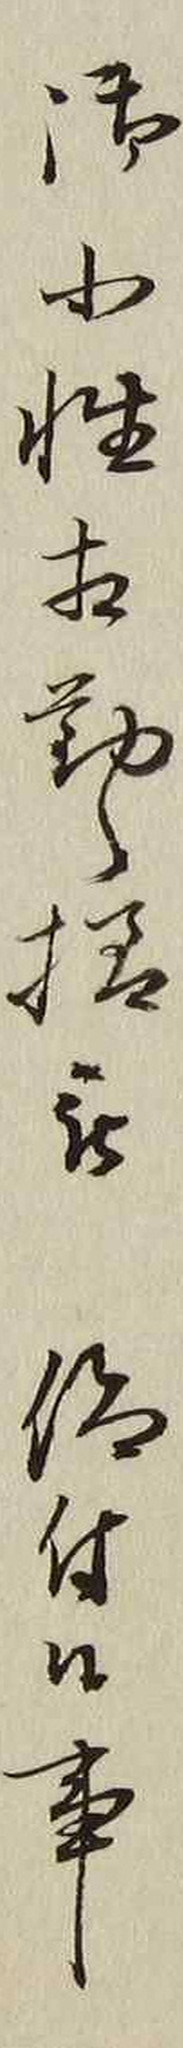御小性相勤候様被仰付候事
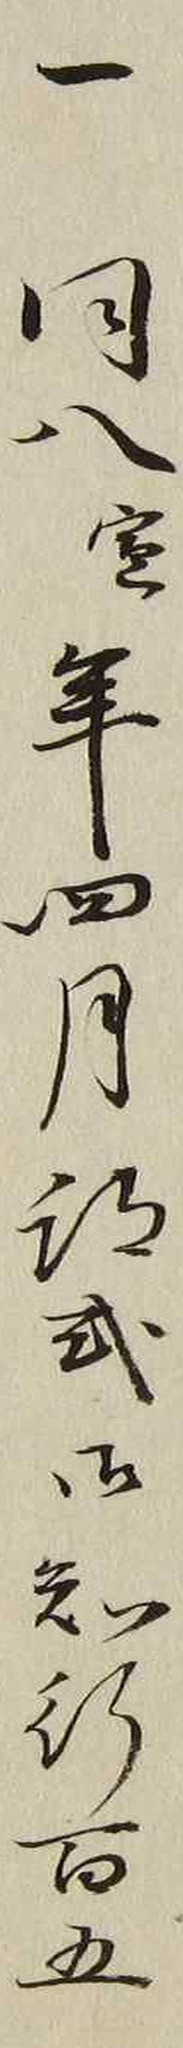一同八寅年四月跡式御知行百五
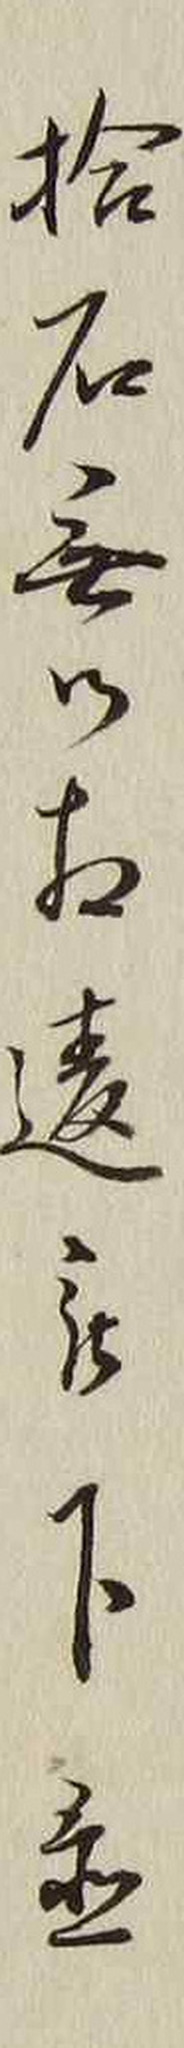拾石無御相違被下置
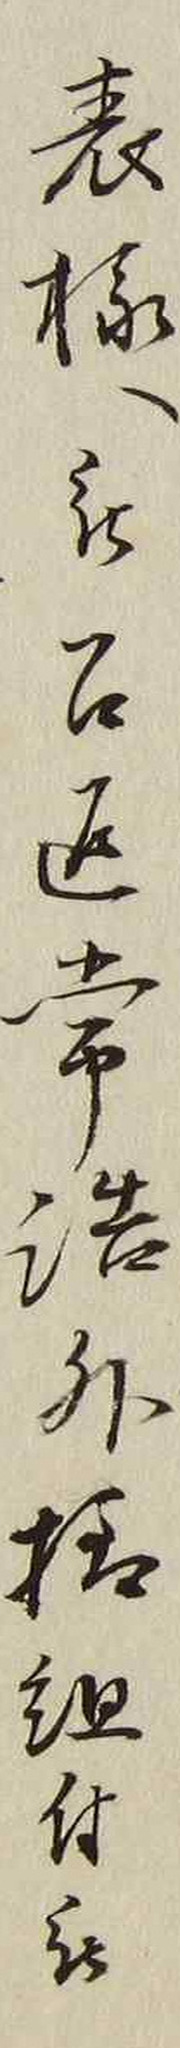表様へ被召返常詰外様組付被
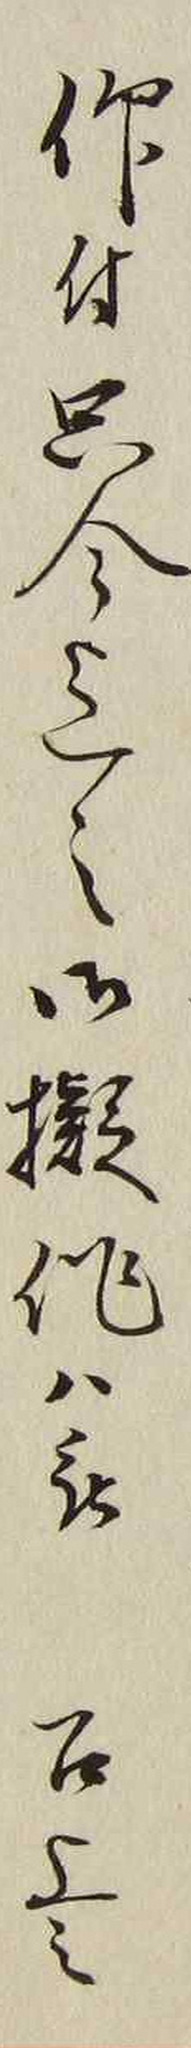仰付只今迄之御擬作ハ被召上之
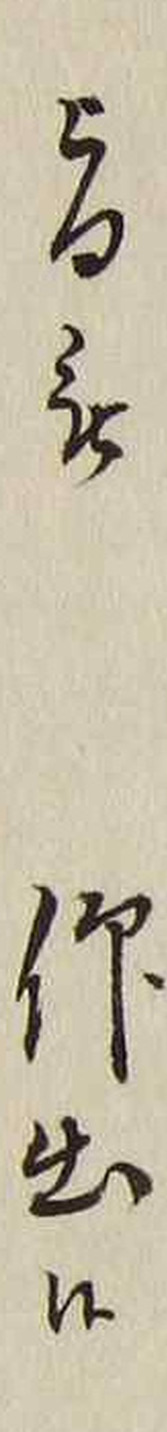旨被仰出候

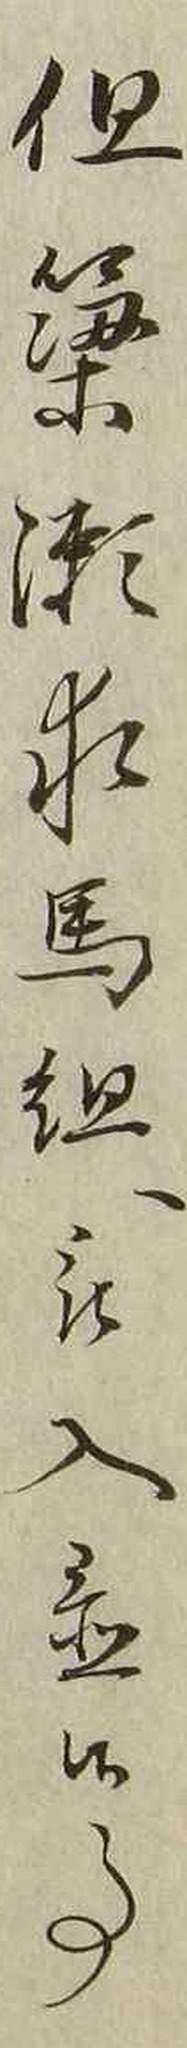但簗瀬求馬組へ被入置候事
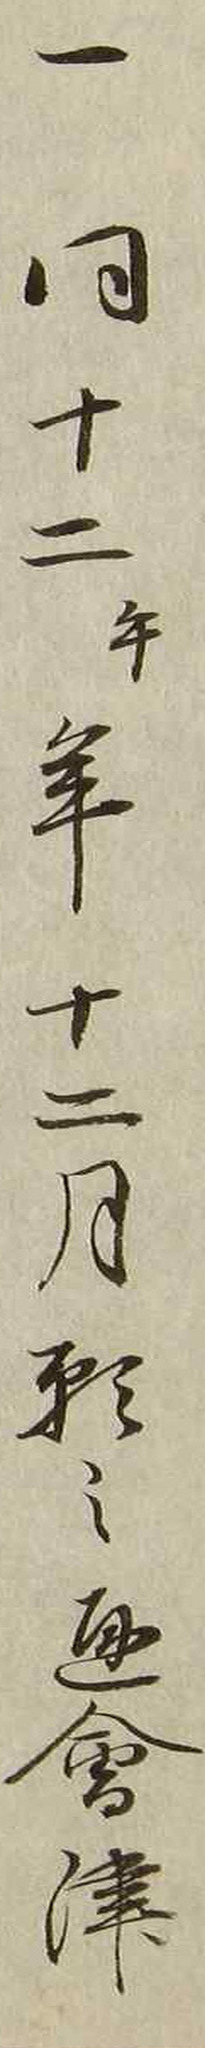一同十二午年十二月願之通会津
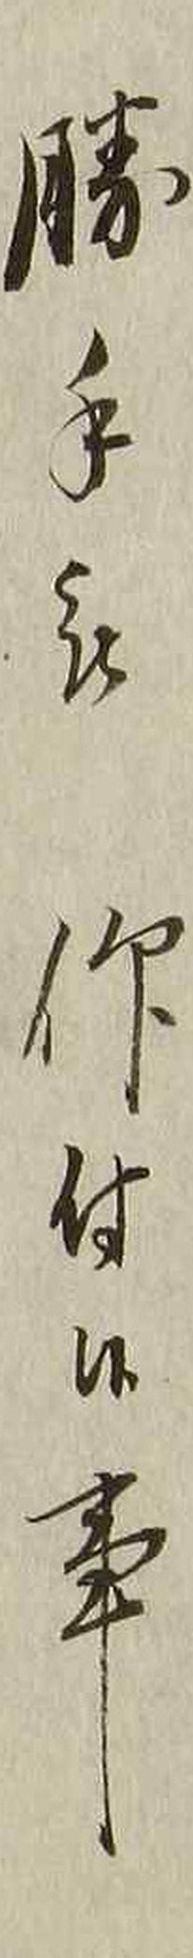勝手被仰付候事
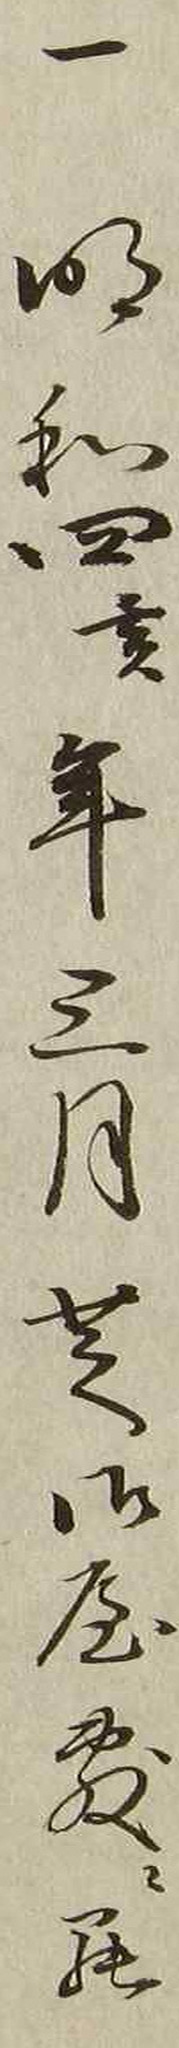一明和四亥年三月芝御屋敷ニ罷
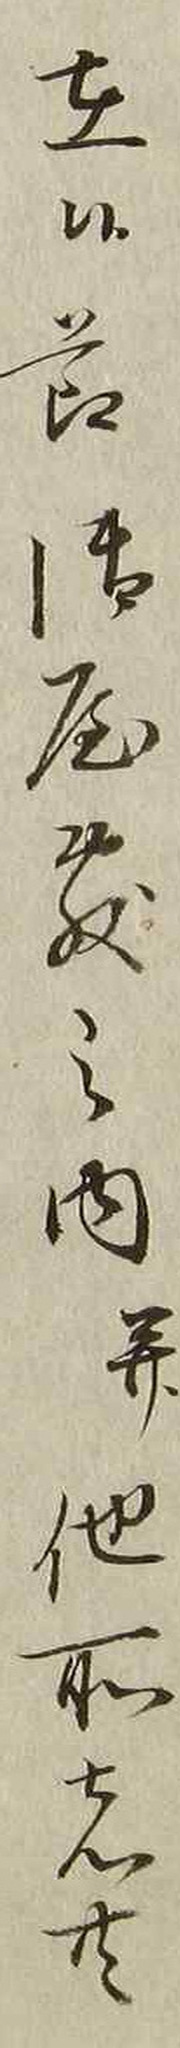在候節御屋敷之内并他所者共
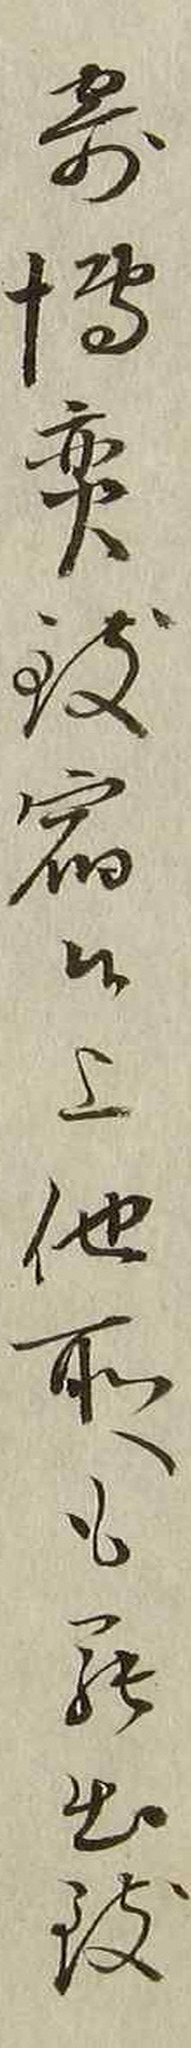寄博奕致宿候上他所へも罷出致
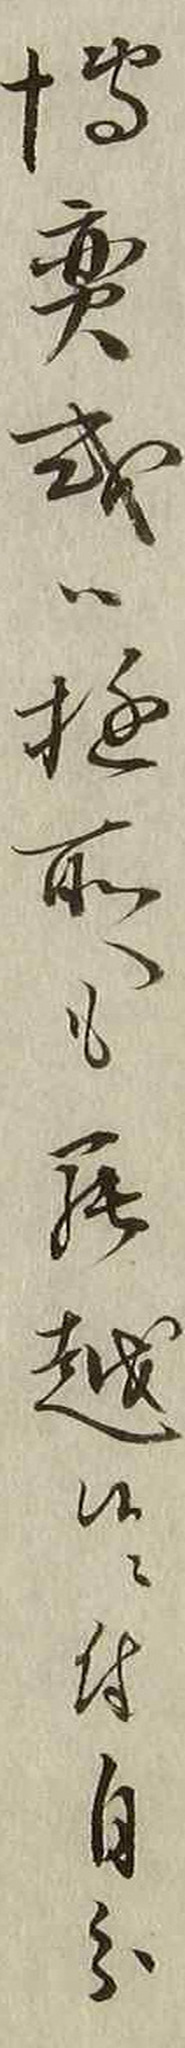博奕或ハ遊所へも罷越候ニ付自分
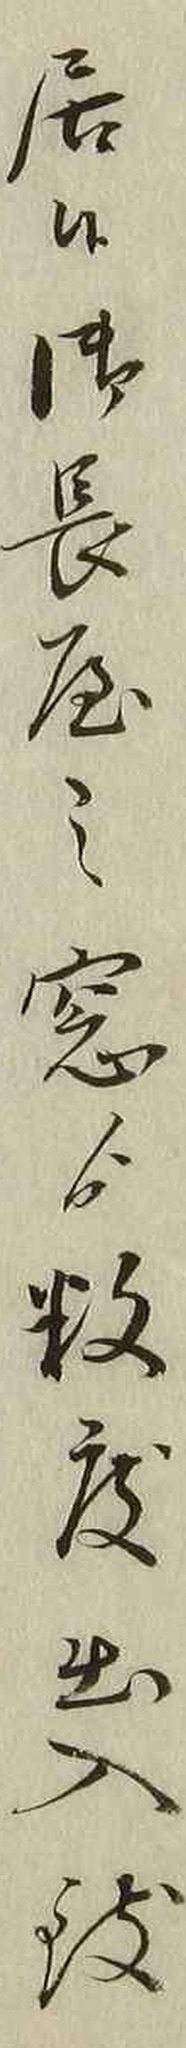居候御長屋之窓ゟ数度出入致
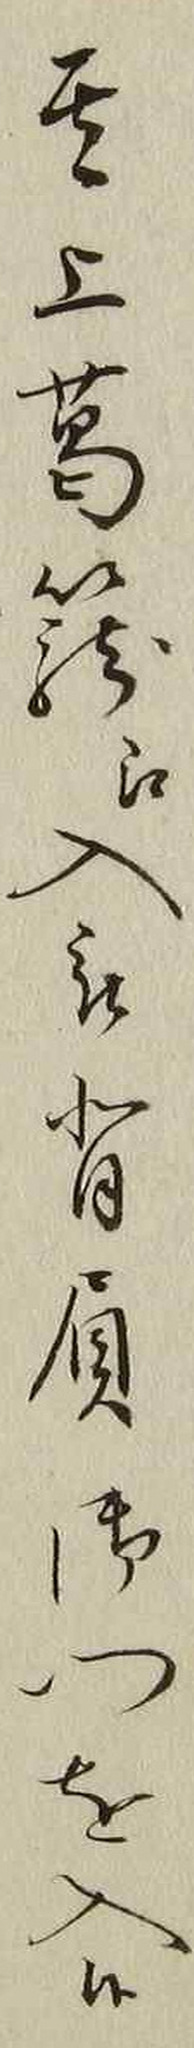其上葛籠江入被背負御門を入候
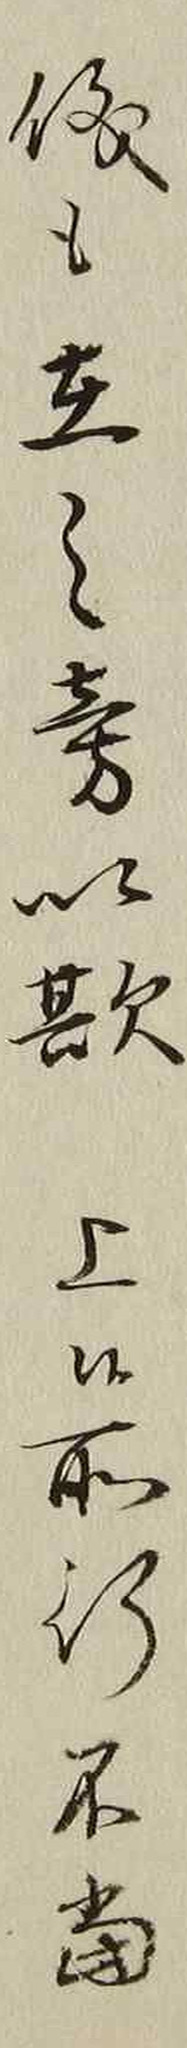儀も在之旁以欺上候所行不当
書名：諸士系譜　巻之22　い之部22
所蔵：会津若松市立会津図書館
